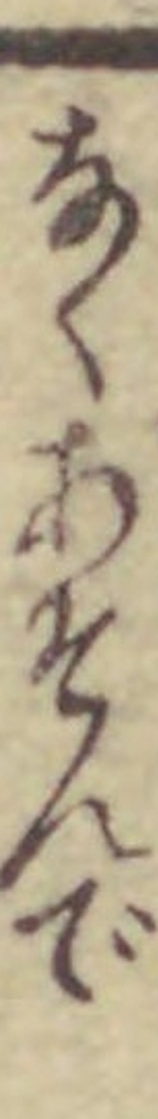なくあそんで
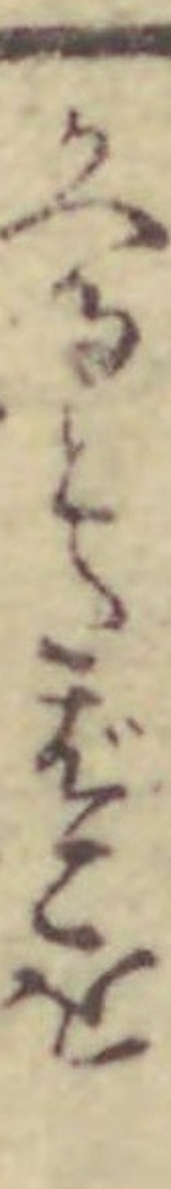かへるとたばこを
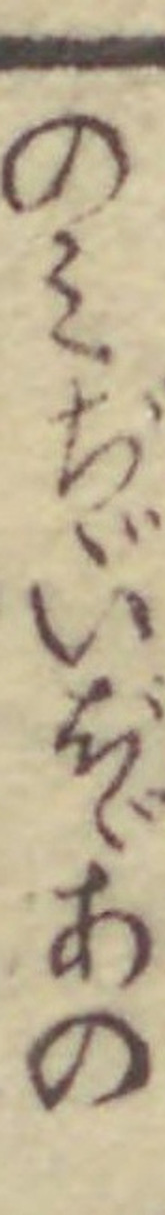のみぢゞいばゞあの
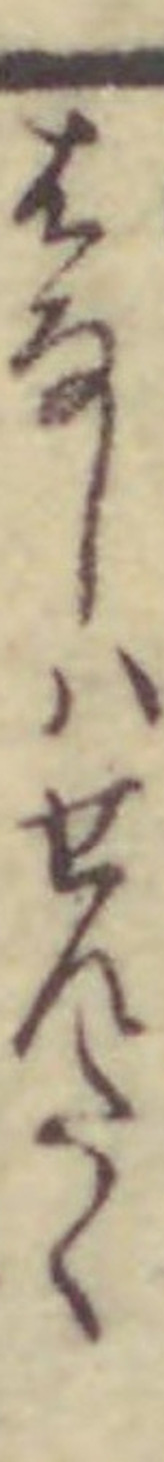はなしはせんたく
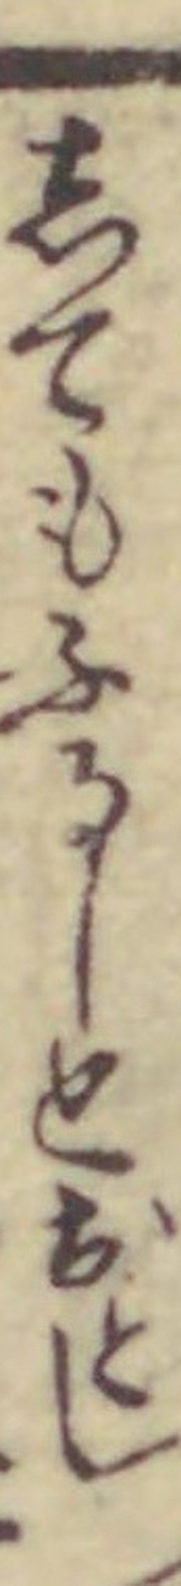してもふるしとおとし
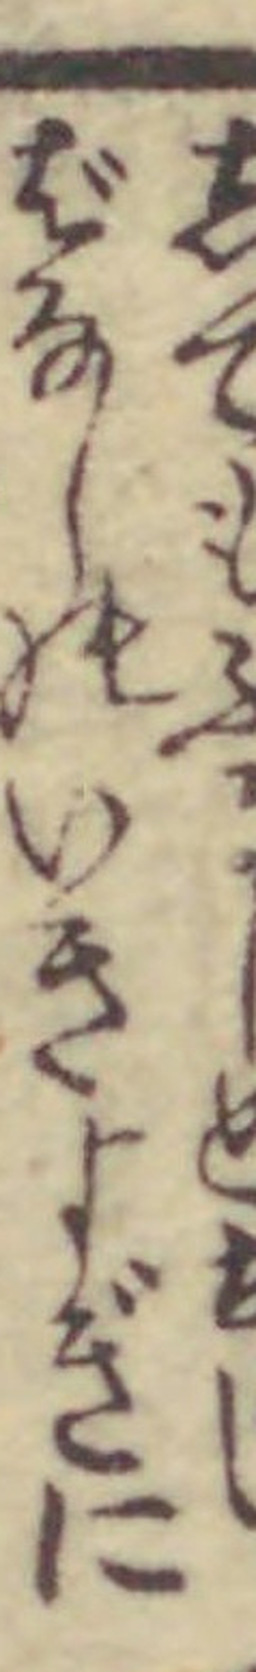ばなしのいきすぎに
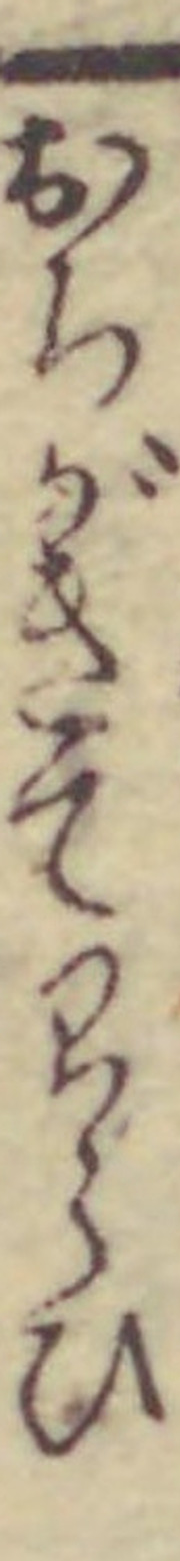おちがきてわらひ
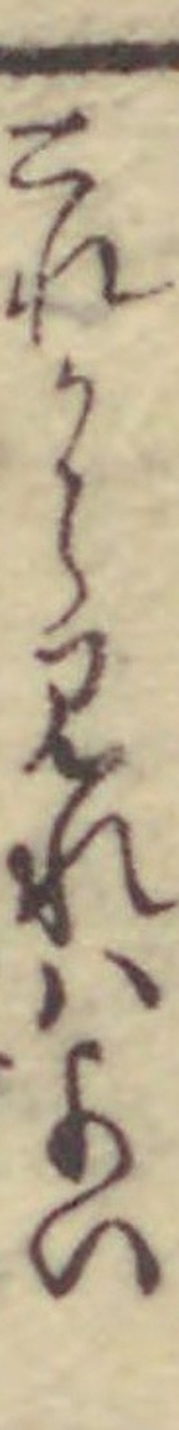これから見れはよい
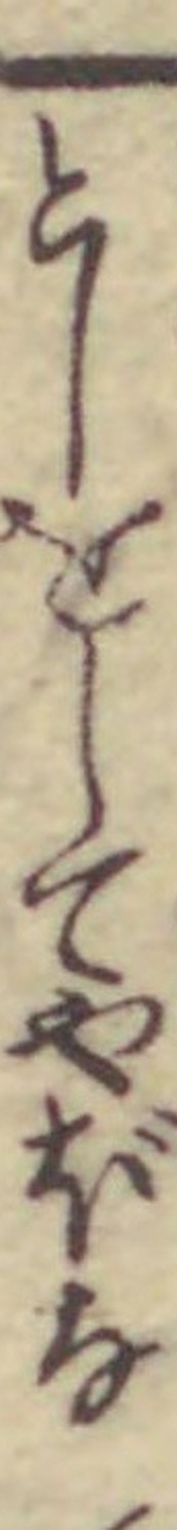としをしてやぼな
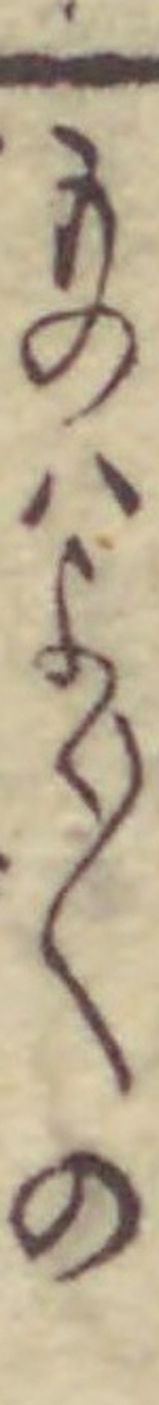ものはよく〳〵の
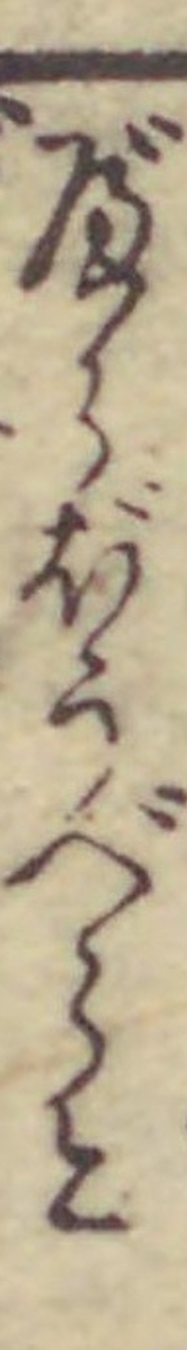べらぼうべらと
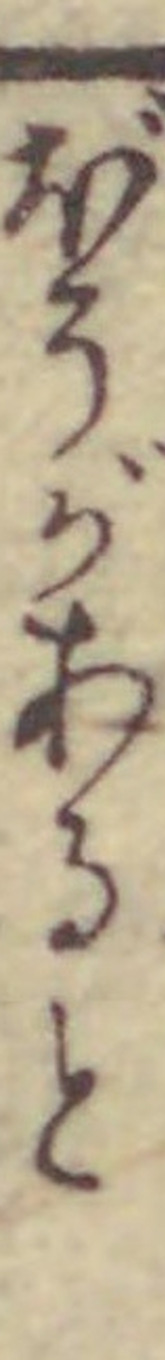ぼうがあると
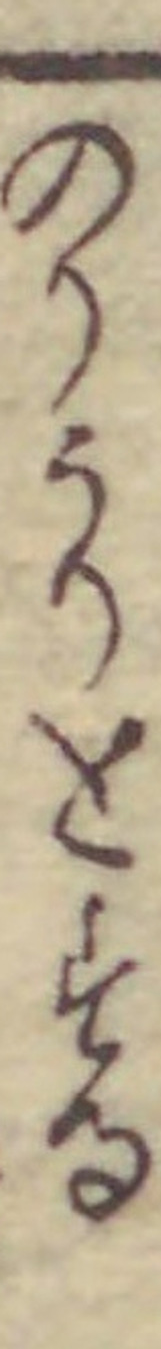のりうりをすると
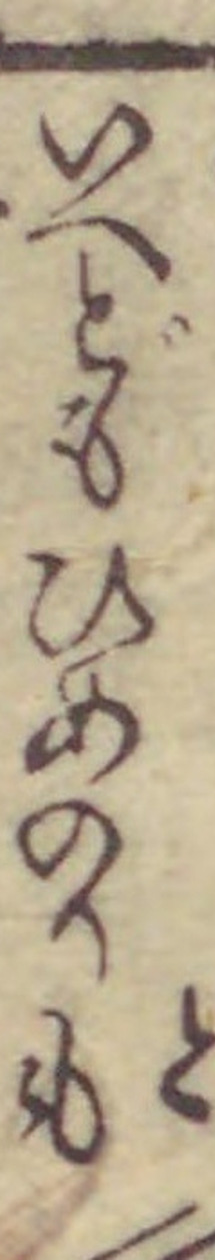いへどもひめのりも
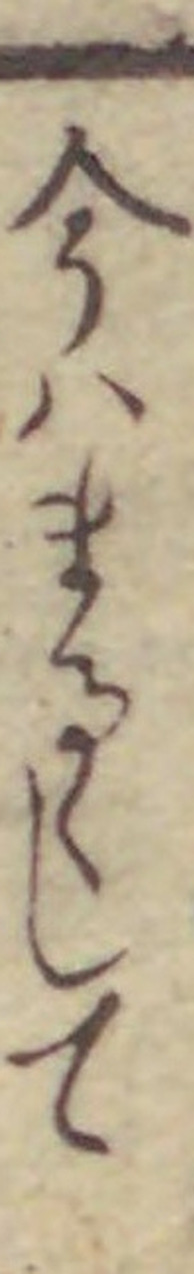今はまるくして
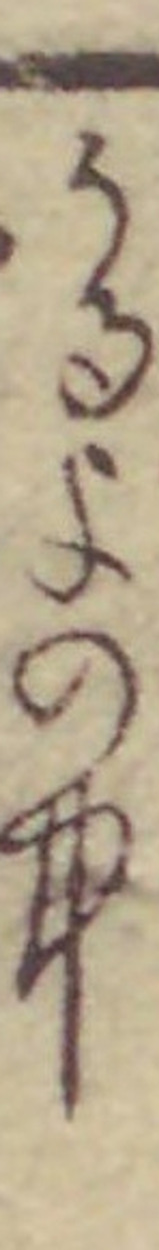うるよの中
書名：大通人穴[サガシ] 3巻
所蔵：国立国会図書館 National Diet Library, JAPAN
